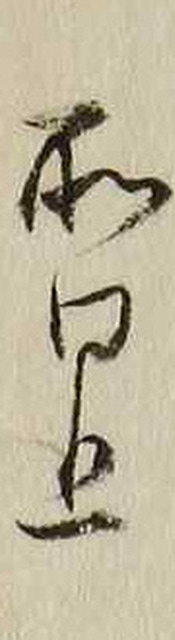所同上
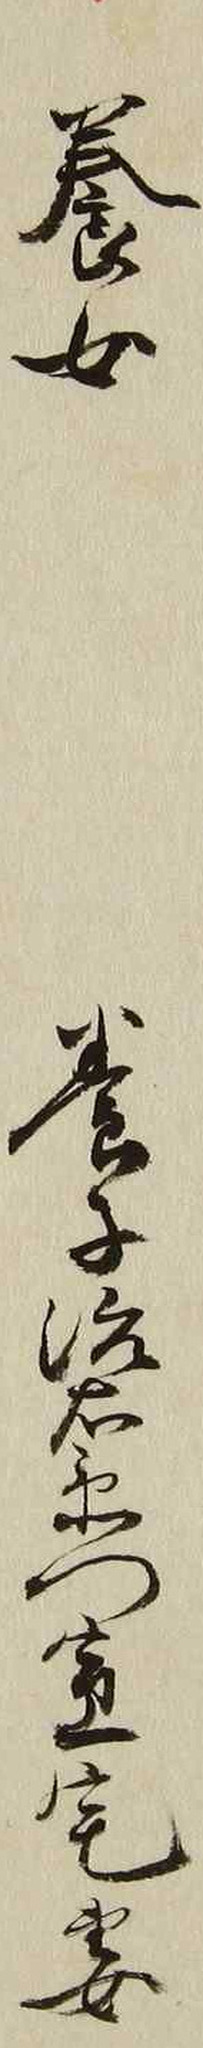養女養子治右衛門宣宅妻
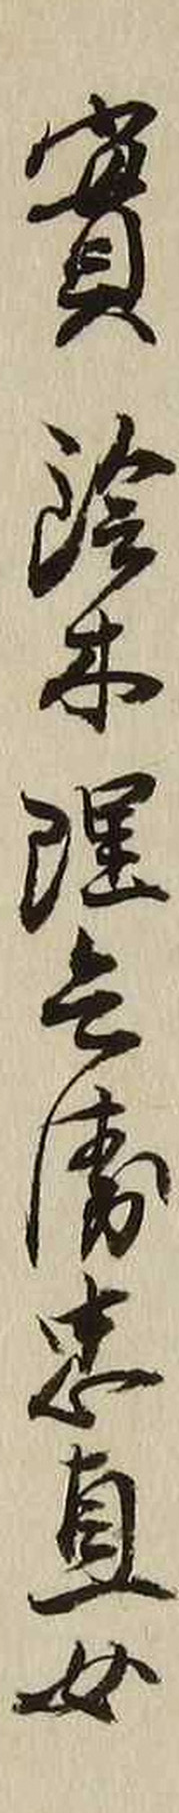実鈴木理兵衛忠直女
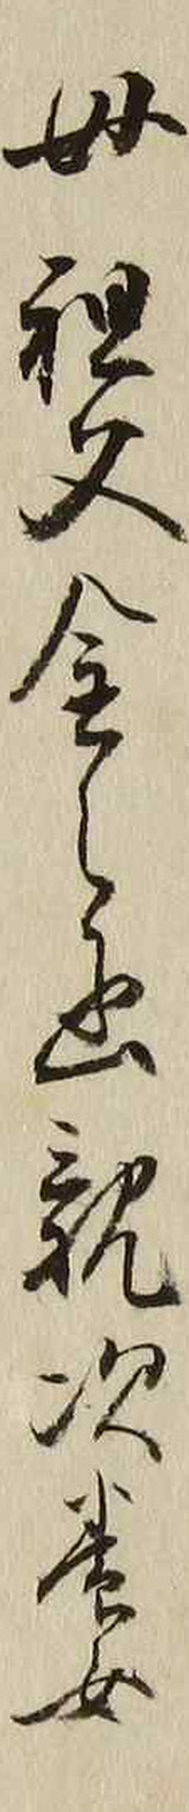母祖父金之丞親次養女
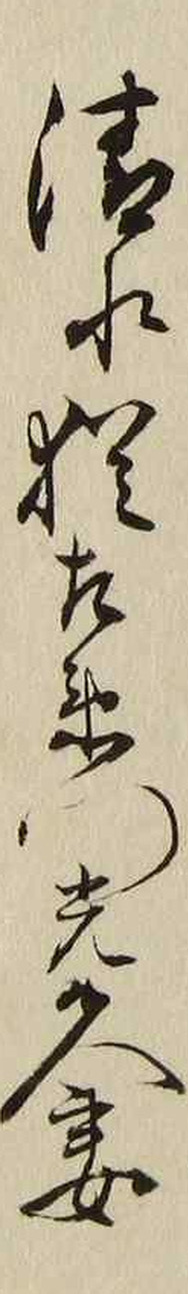女清水猶左衛門光久妻

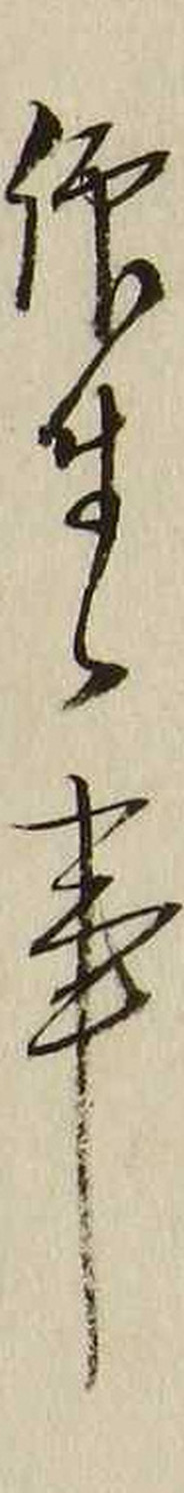仰付候事
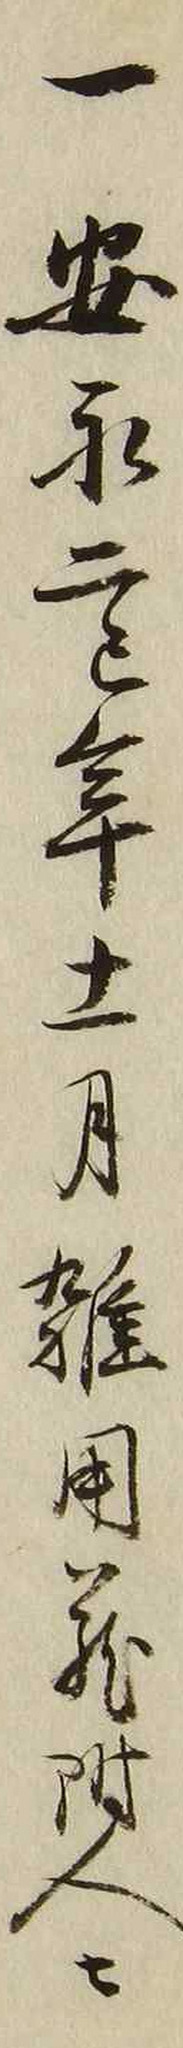一安永二巳年十一月雑用蔵附人被
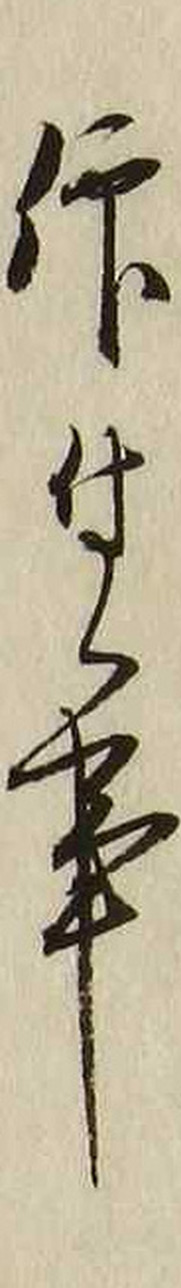仰付候事
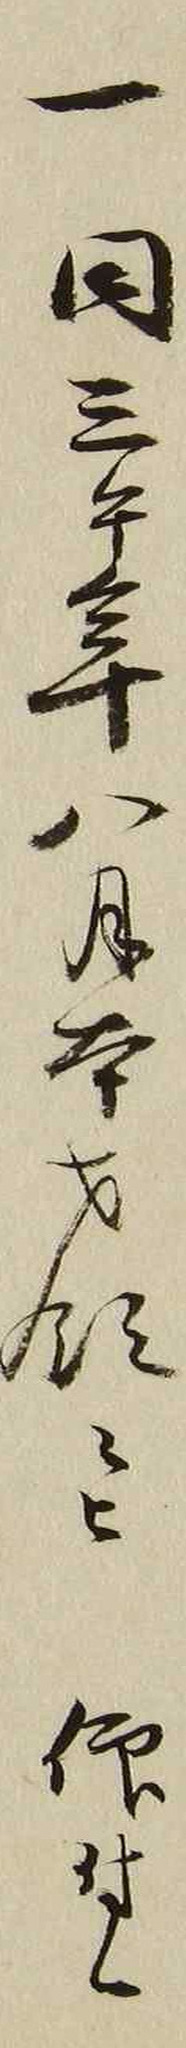一同三午年八月本才領ニ被仰付候
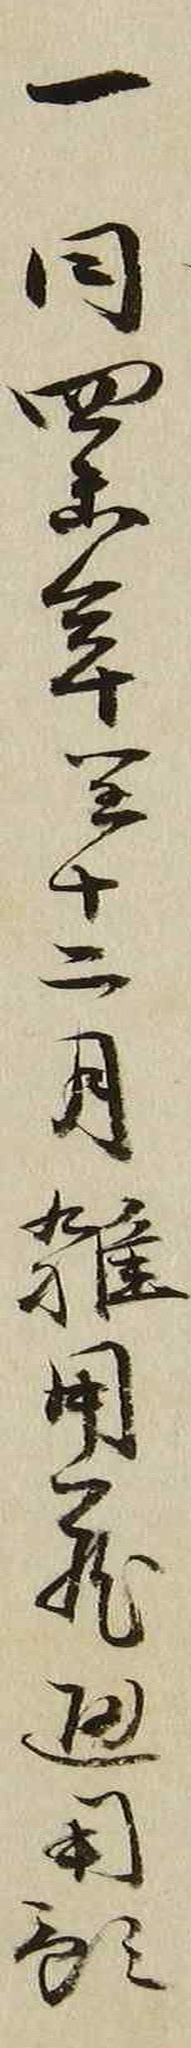一同四未年閏十二月雑用蔵通用預
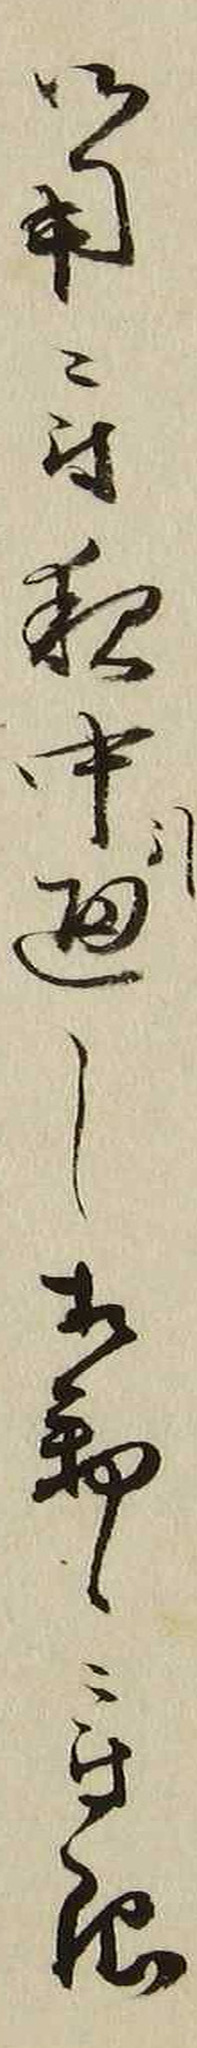御用ニ付夜中引通し相勤候ニ付銀
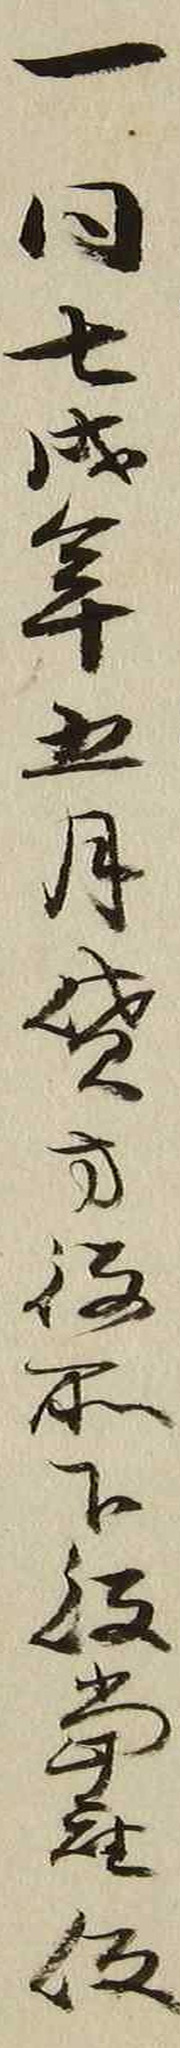一同七戌年五月貸方役所下役当座仮
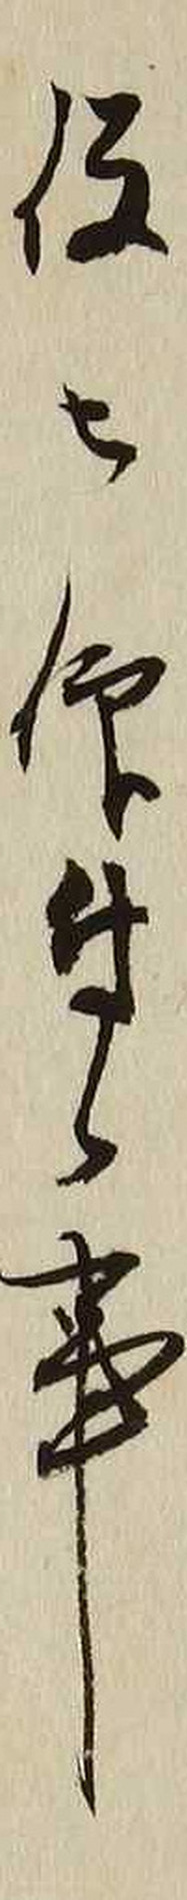役被仰付候事
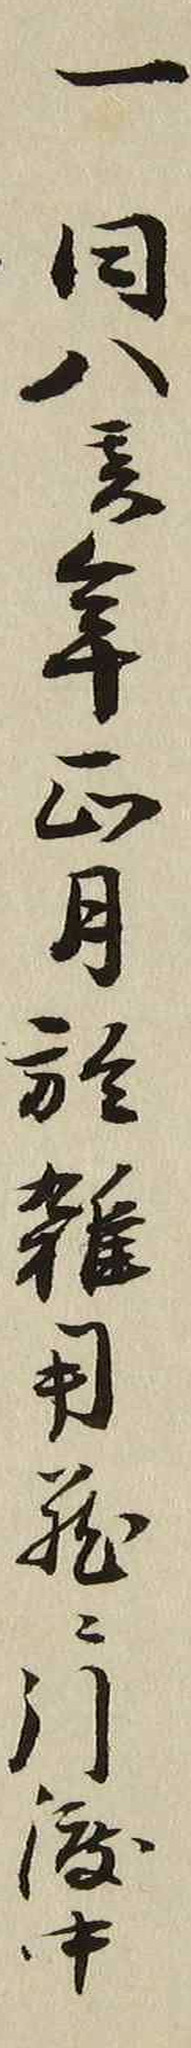一同八亥年正月於雑用蔵ニ引渡中
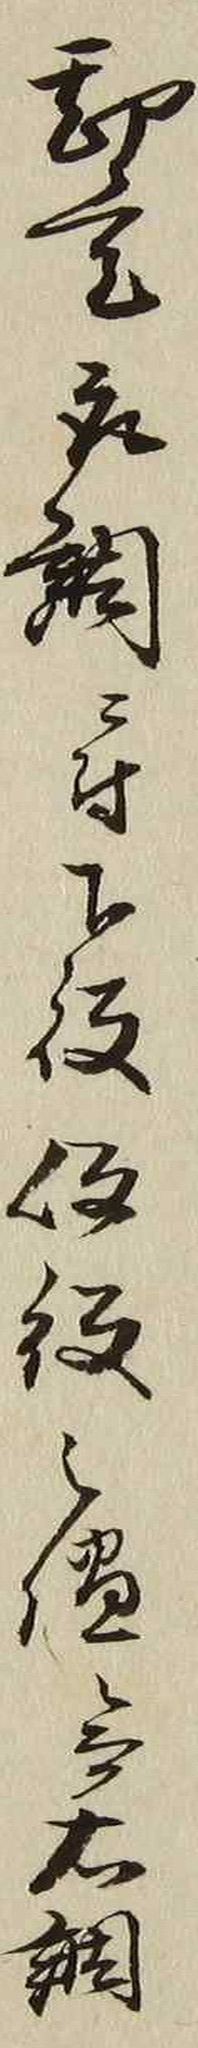勘定取調ニ付下役仮役之侭ニ而右調
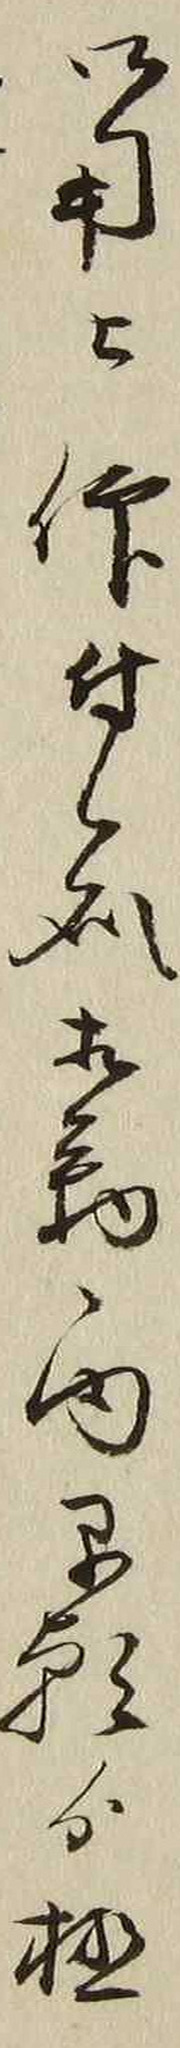御用被仰付候処相勤候内早朝ゟ極
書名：諸士系譜　巻之291　さ之部23
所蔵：会津若松市立会津図書館
